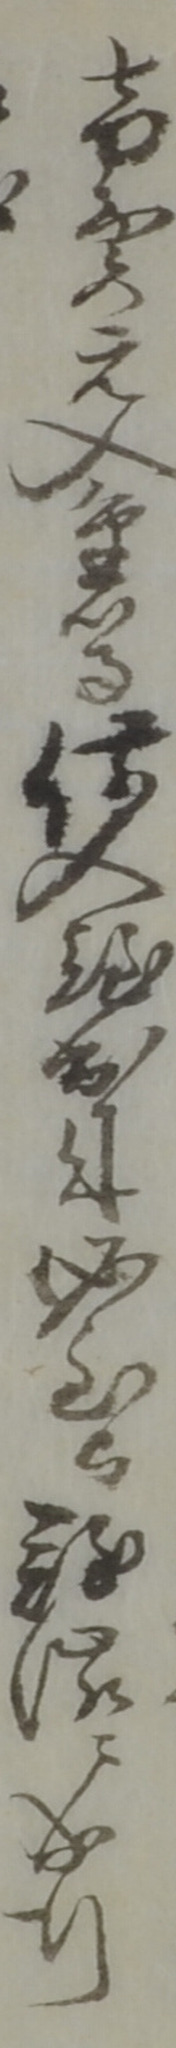商売元入金等借入難出来必至と難渋ニ成行
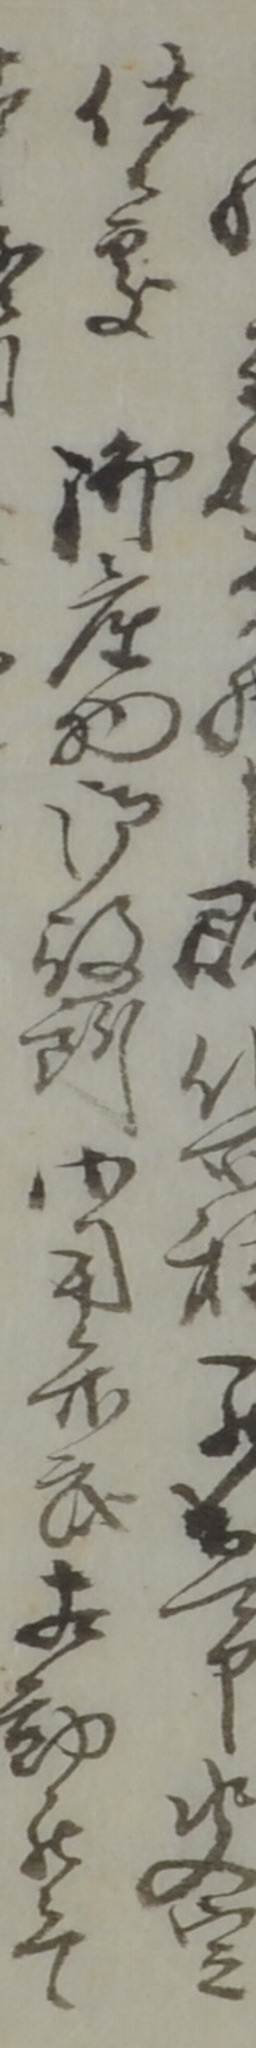仕候處御産物御役所御用弁も相勤候罷在候
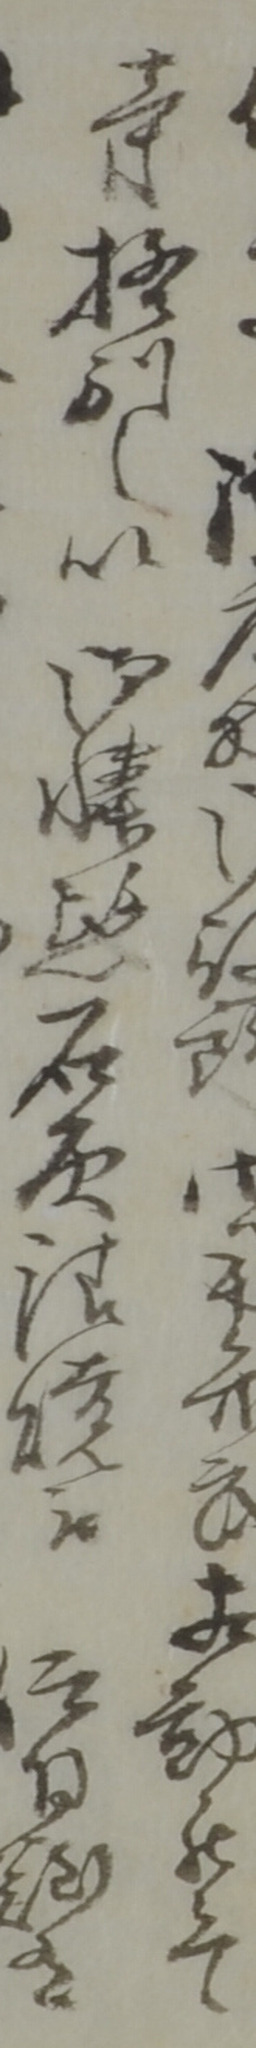旁格別之以御憐愍石灰請焼被仰付難有
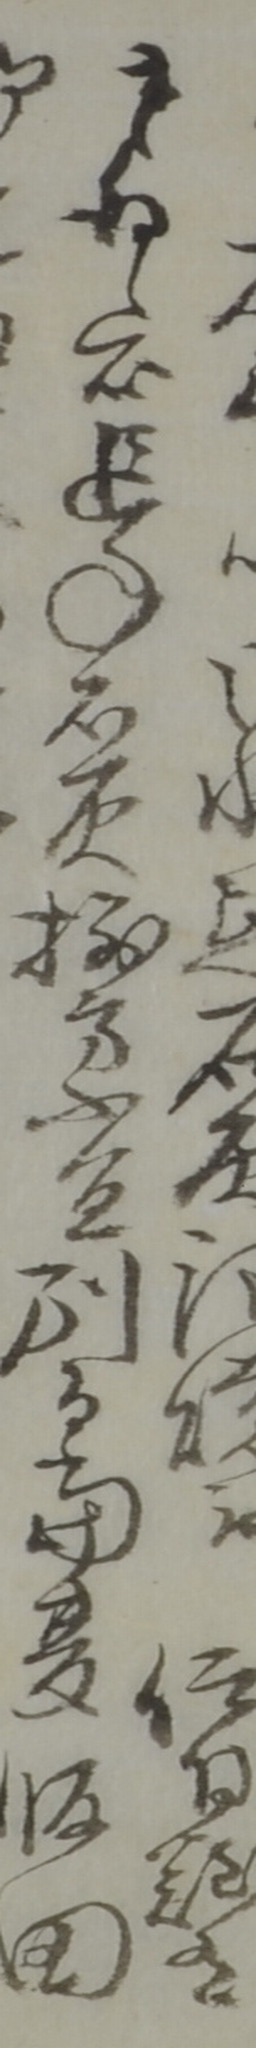奉存候所追年石灰捌方不宜別而当夏飯田
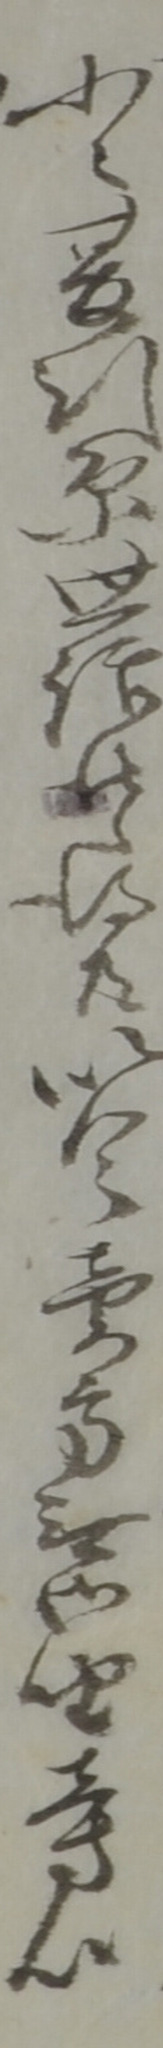少々夏引原世話仕候得共以今売方無御座旁以
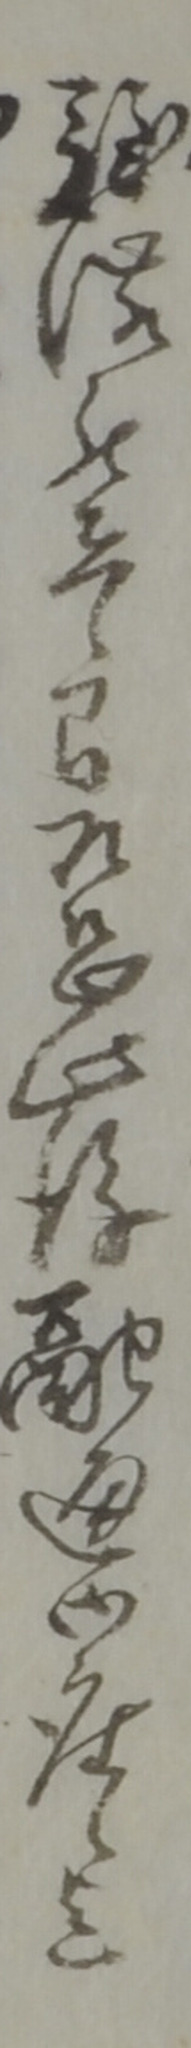難渋罷在候間乍恐此後融通御座候迄
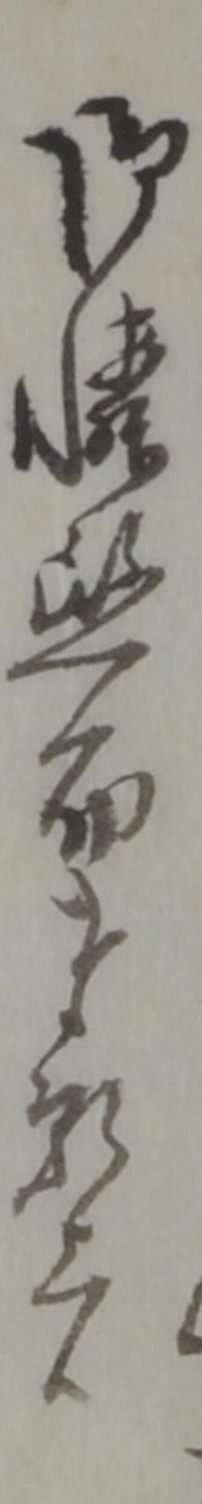御憐愍筋奉願上候
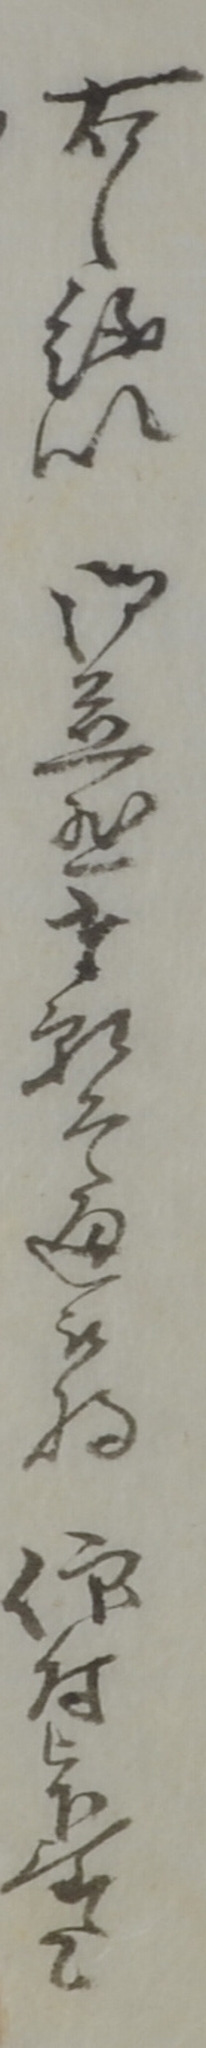右之趣以御慈悲奉願上候通被為仰付被下置候はゝ
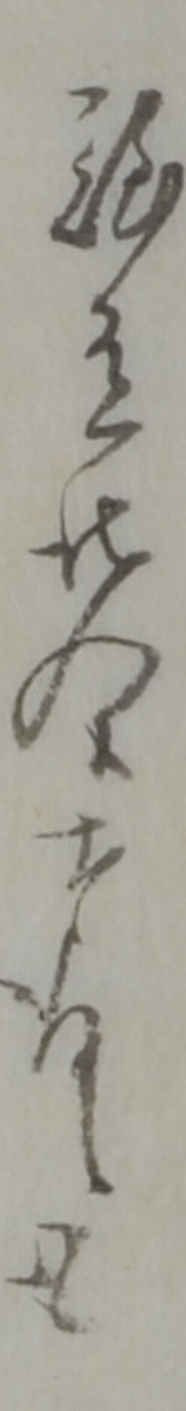難有仕合奉存候以上

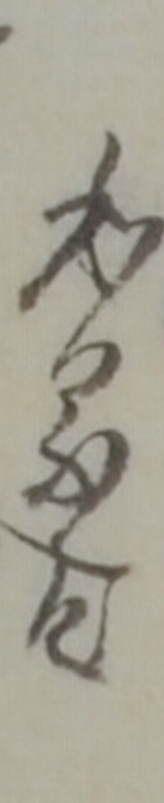和泉屋
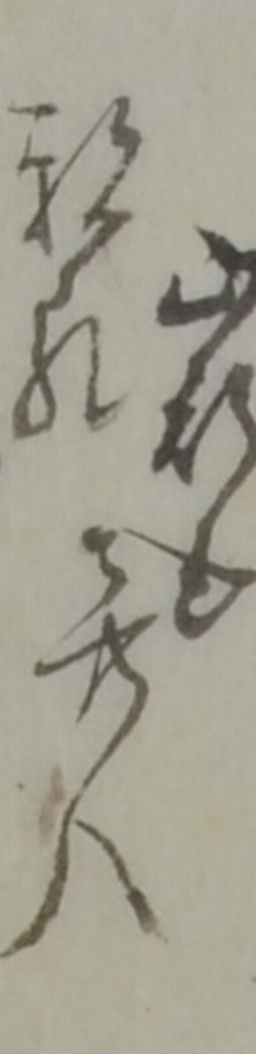親類喜八
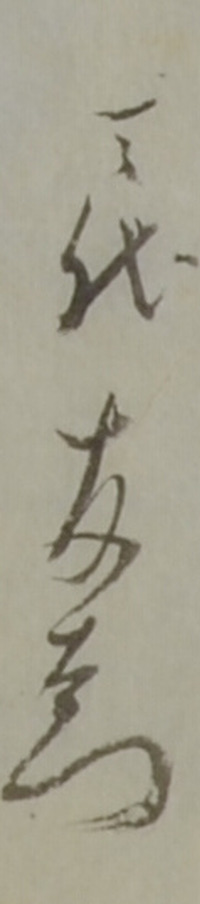丁代友右衛門
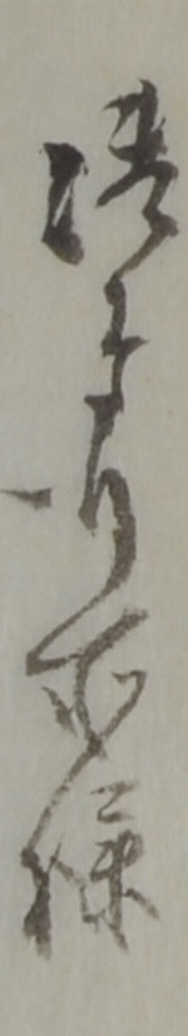御奉行所様
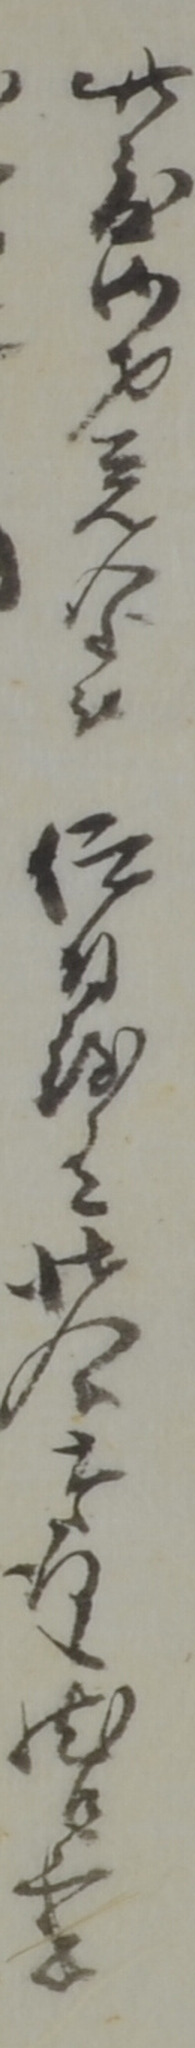此度御才覚金被仰付難有仕合奉存候然ル上は
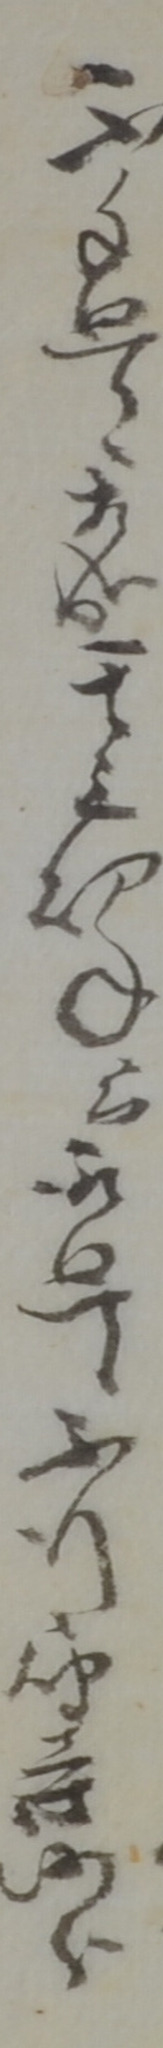不手廻りニ相成其上幼年ニ而取廻し不行届旁何分
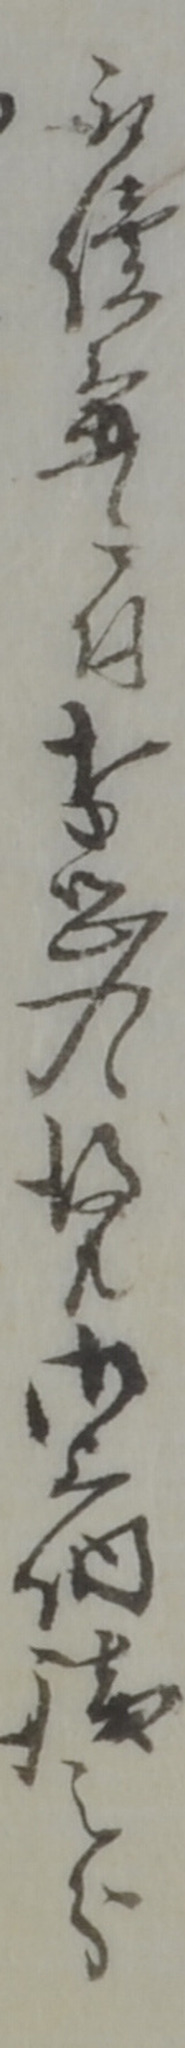取続兼候ニ付奉恐入候得共御上納残之分
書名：諸願書控簿
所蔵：伊那市立高遠町図書館・合同会社AMANE
